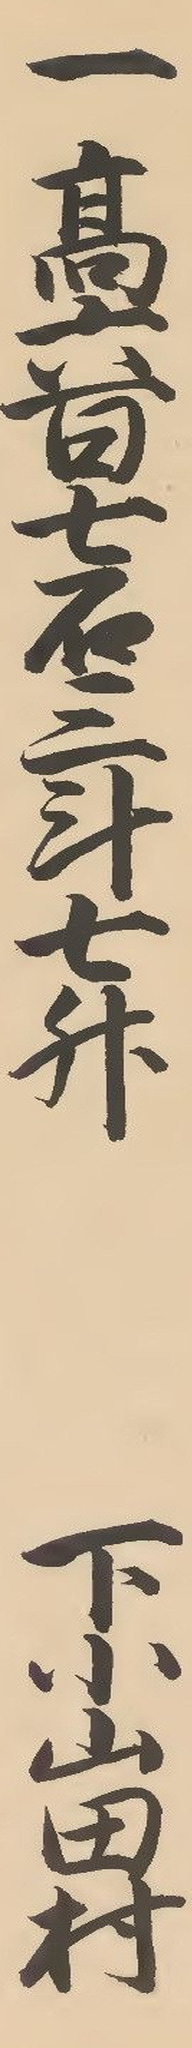一高六百七石三斗七升下小山田村
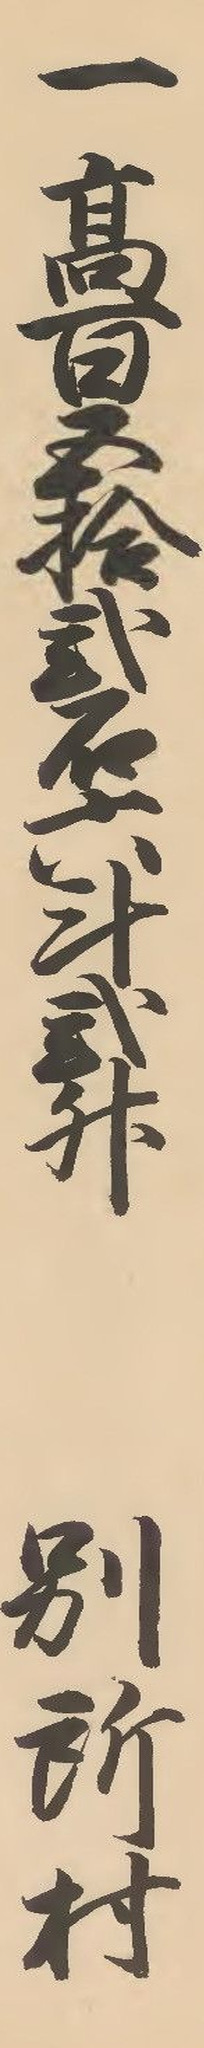一高百五拾弐石六斗弐升別所村
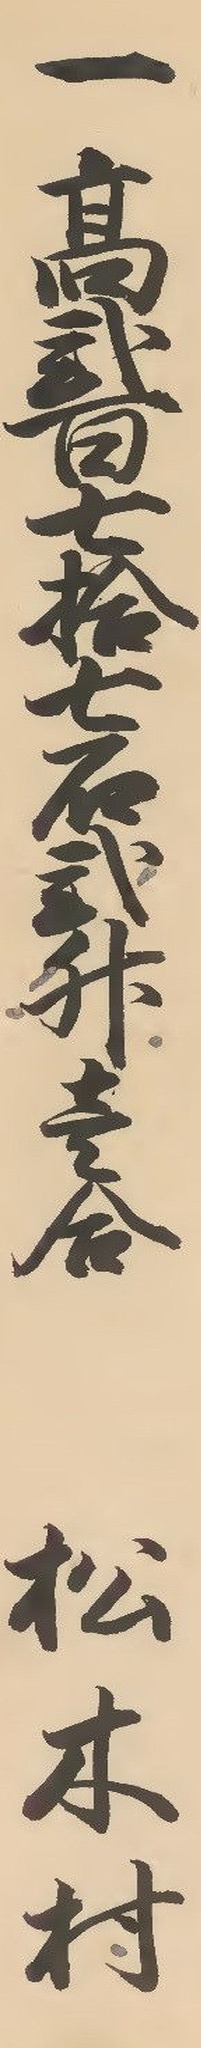一高弐百七拾七石弐升壱合松木村

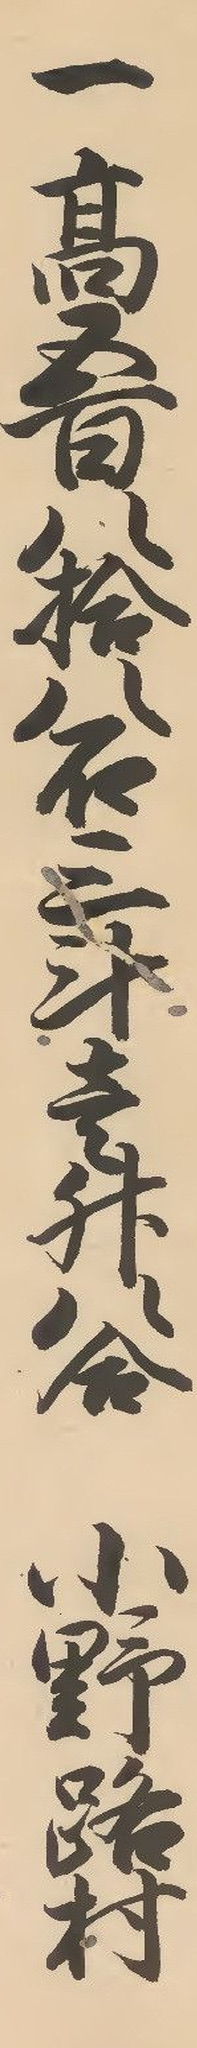一高五百八拾八石三斗壱升八合小野路村
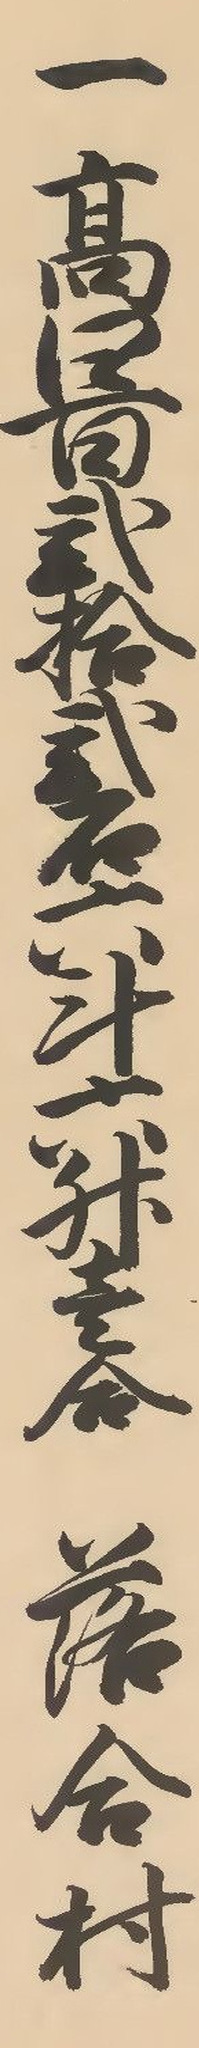一高四百弐拾弐石六斗六升壱合落合村
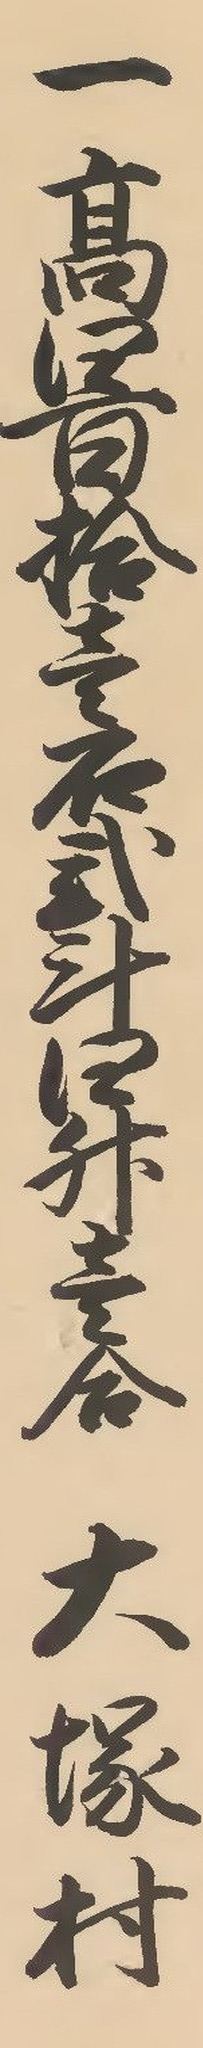一高四百拾壱石弐斗四升壱合大塚村
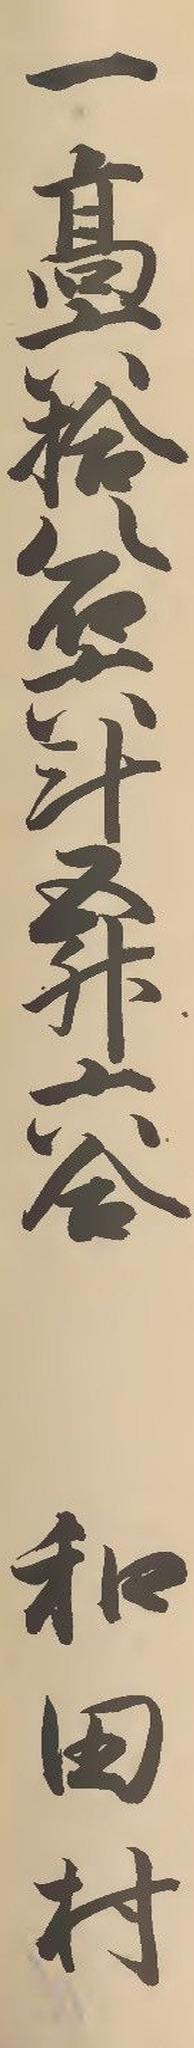一高六拾八石六斗五升六合和田村
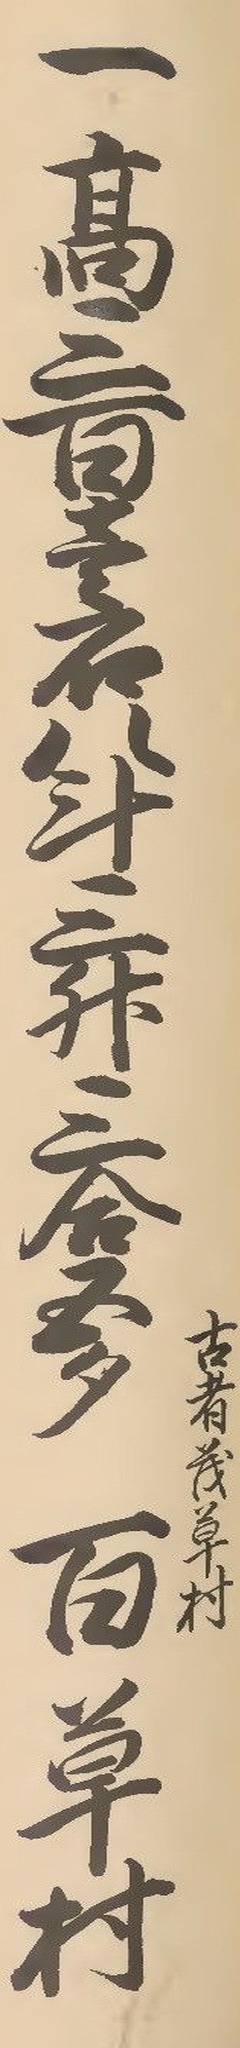一高三百壱石八斗三升三合五勺百草村
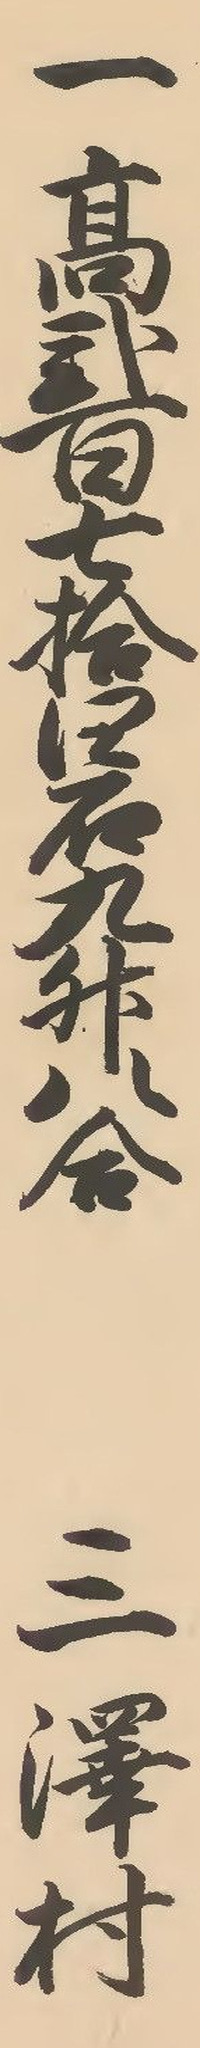一高弐百七拾四石九升八合三澤村
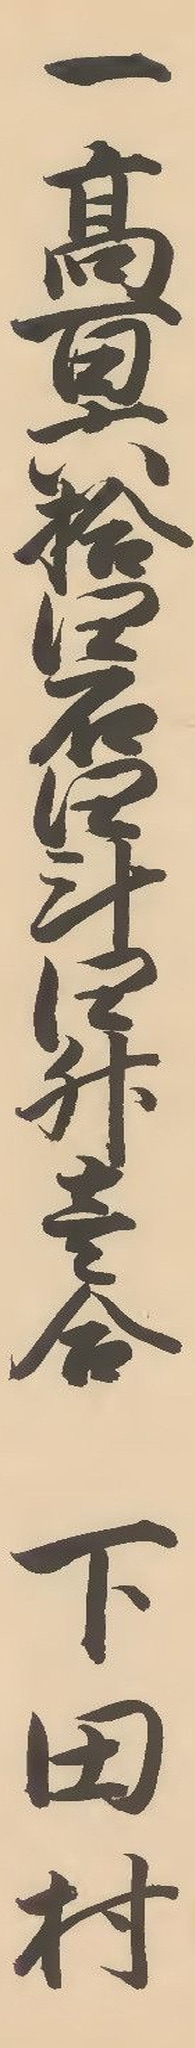一高百六拾四石四斗四升壱合下田村
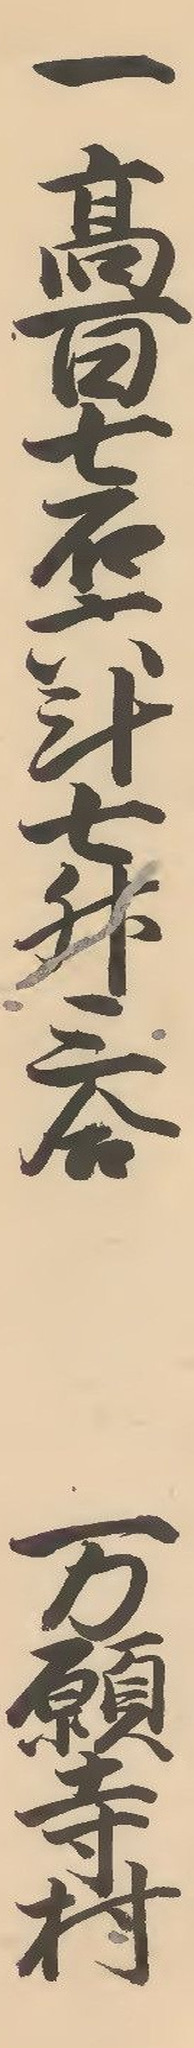一高百七石六斗七升三合万願寺村

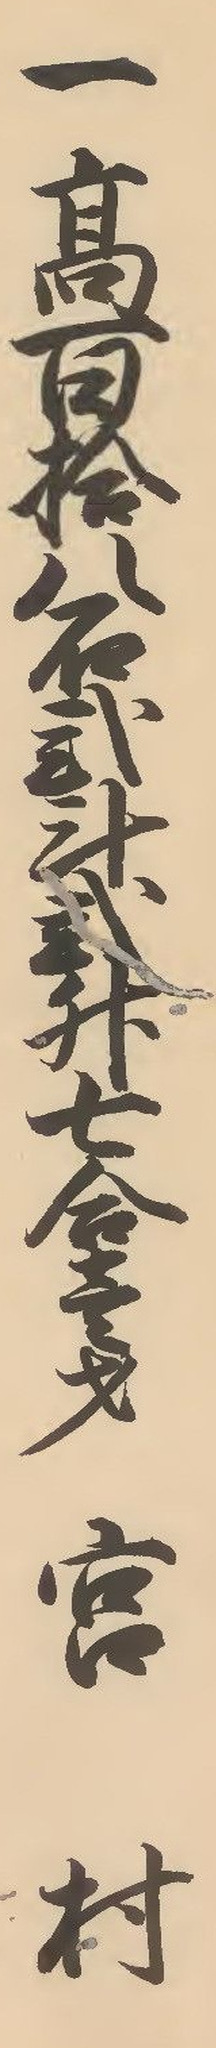一高百拾八石弐斗弐升七合壱才宮村
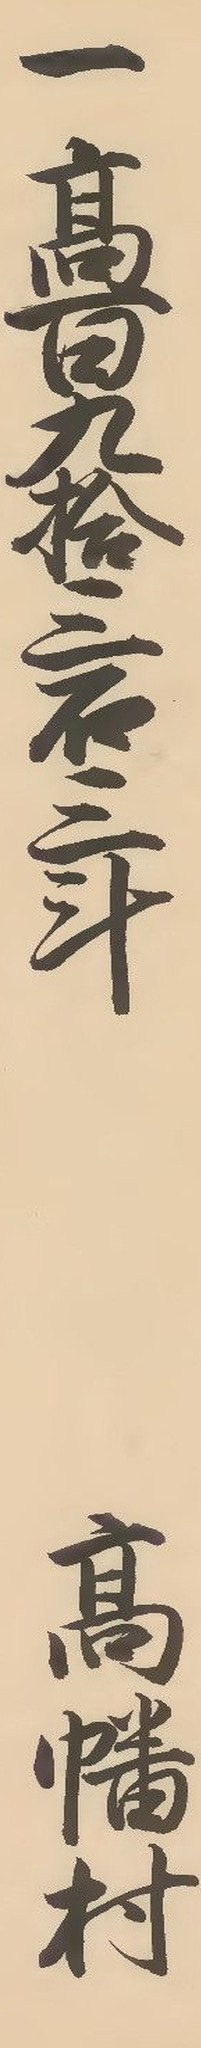一高百九拾三石三斗高幡村
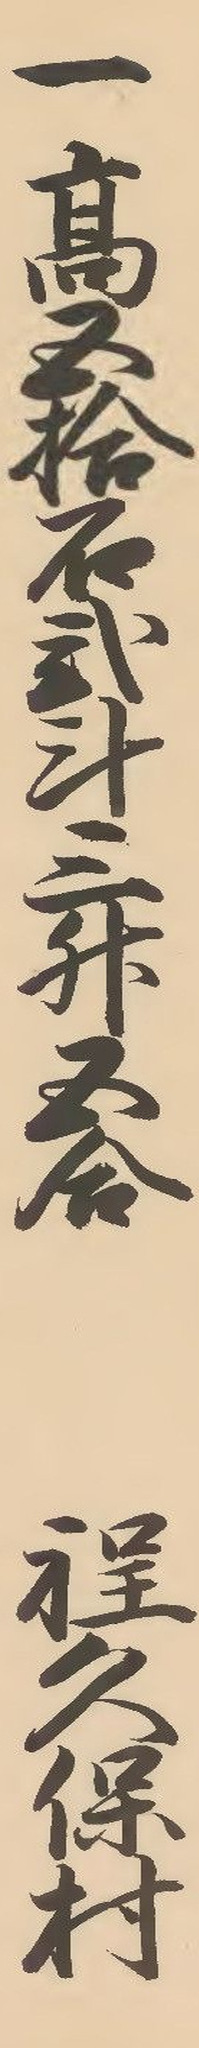一高五拾石弐斗三升五合程久保村
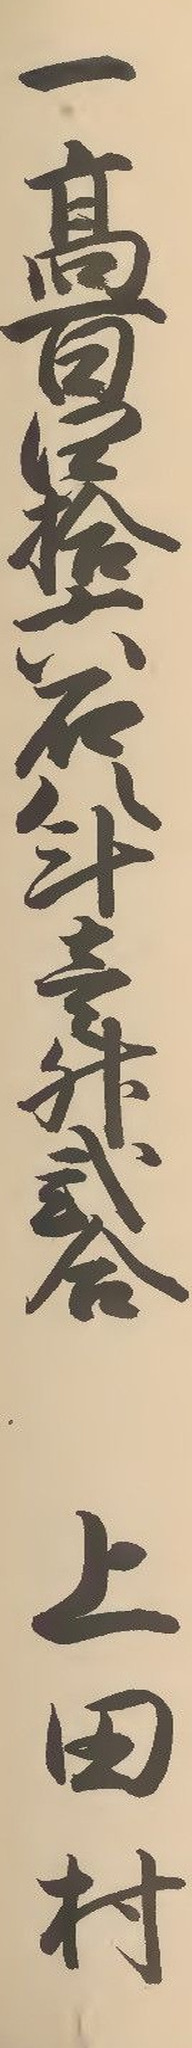一高百四拾六石八斗壱升弐合上田村
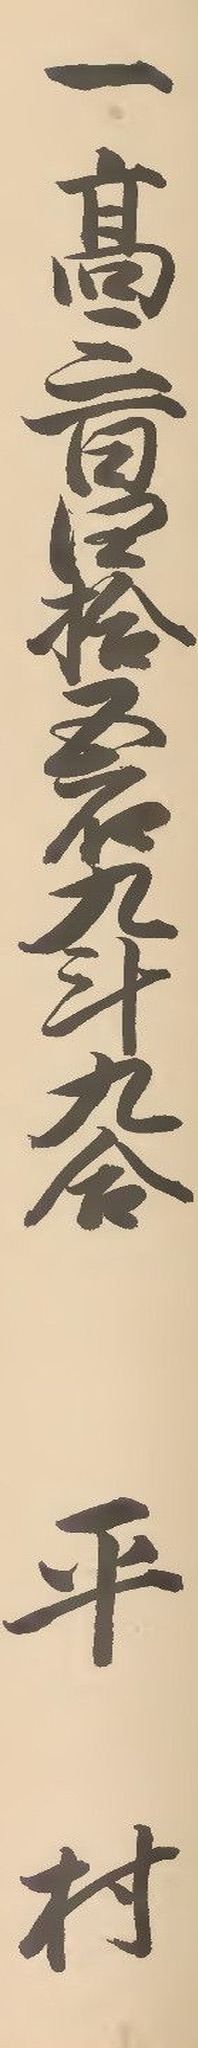一高三百四拾五石九斗九合平村
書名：武蔵国郷帳　上
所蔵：国立公文書館 National Archives of Japan
